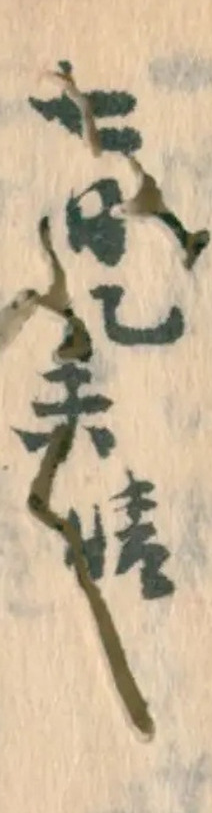七日乙未晴
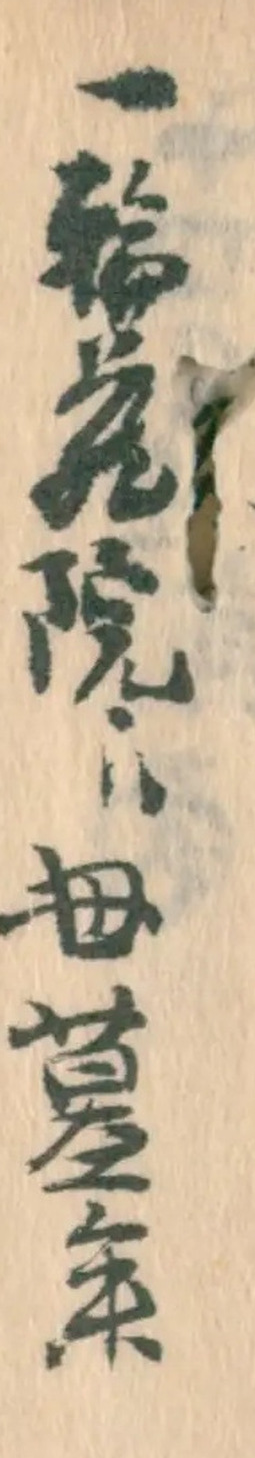一輪蔵院え母墓参
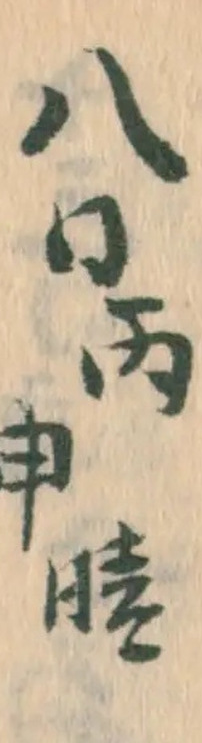八日丙申晴
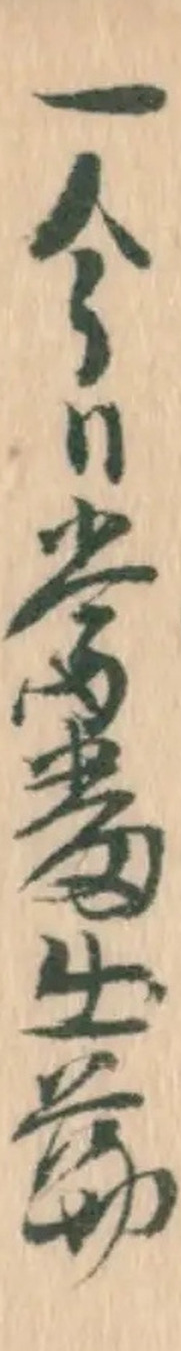一今日当番出勤
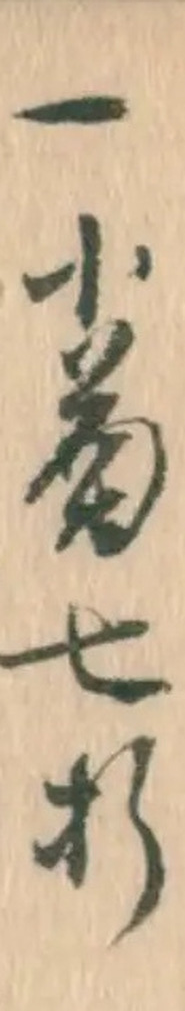一小菊七折
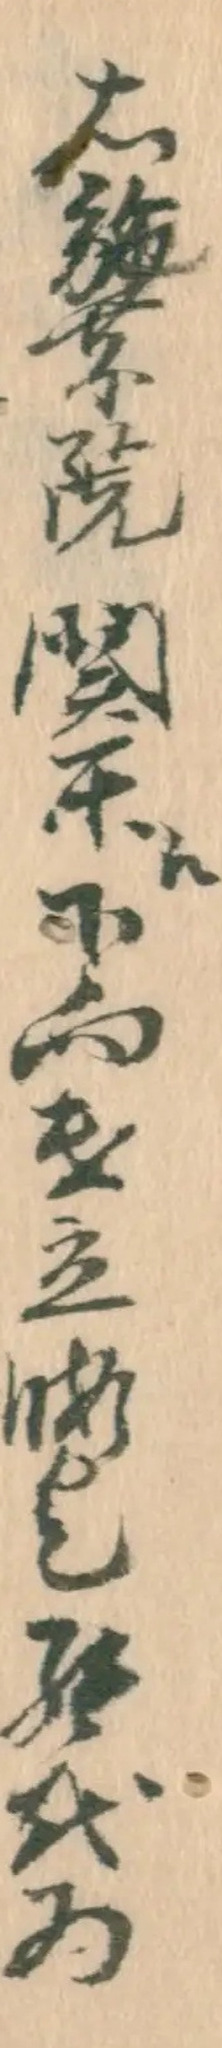右施薬院関東え下向出立暇乞罷越為
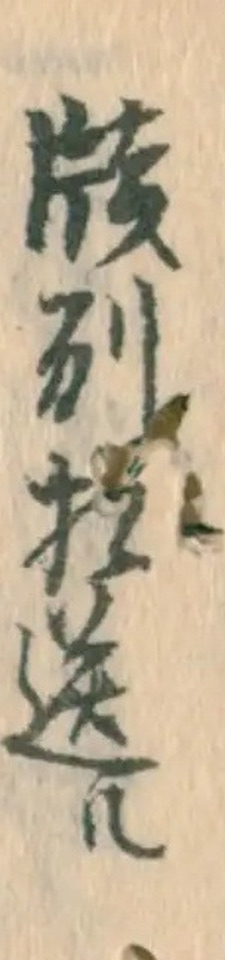牋別指送ル
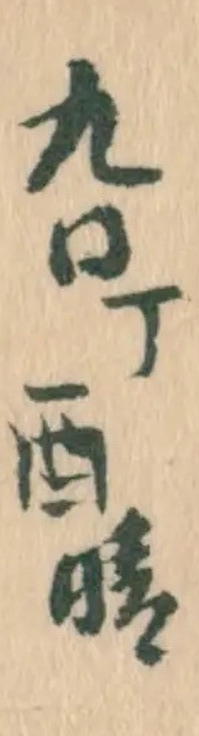九日丁酉晴
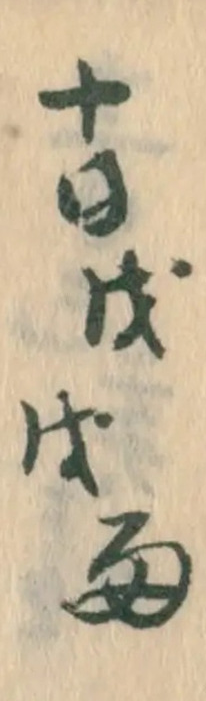十日戊戌雨

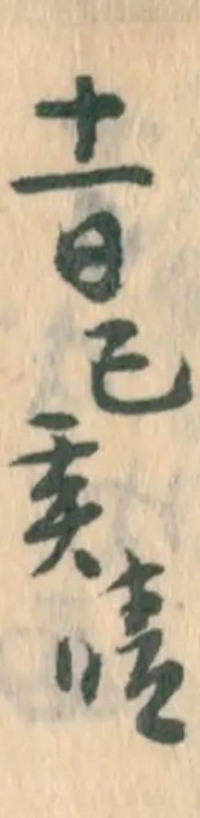十一日己亥晴
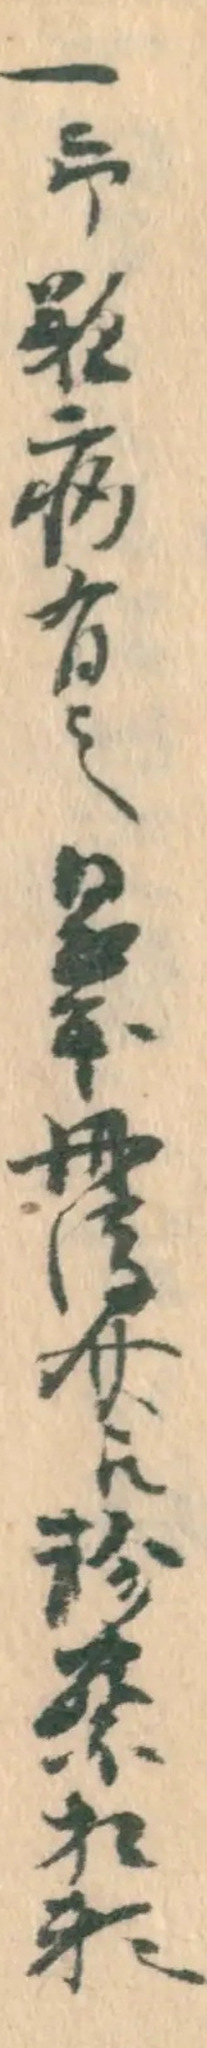一予難病有之岡本丹後介え診察相頼
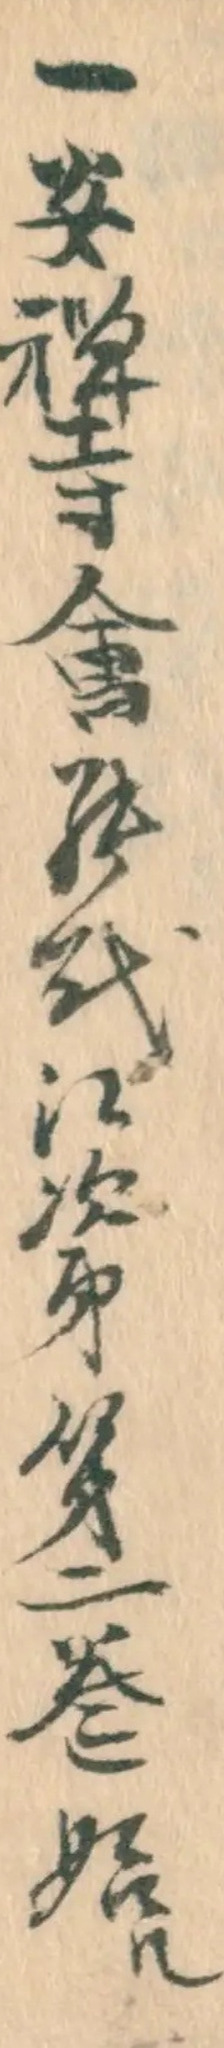一安禅寺会罷越江次第第二巻始ル
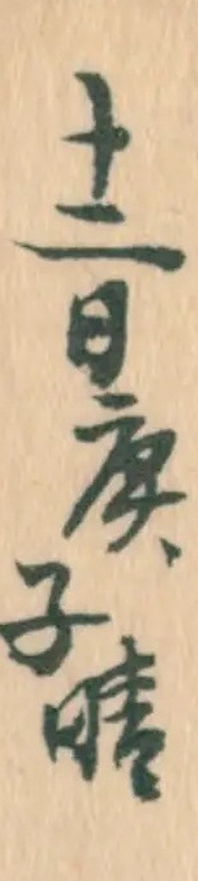十二日庚子晴
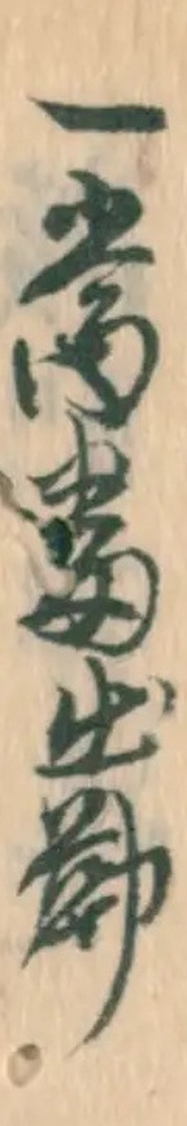一当番出勤
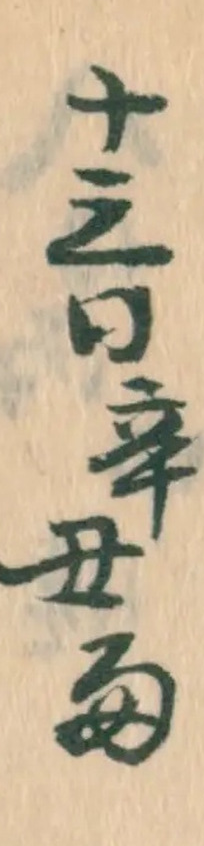十三日辛丑雨
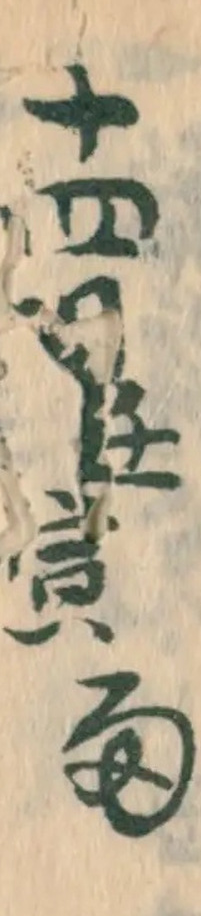十四日壬寅雨
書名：禁裏御所御用日記. [131]
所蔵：国立国会図書館 National Diet Library, JAPAN
